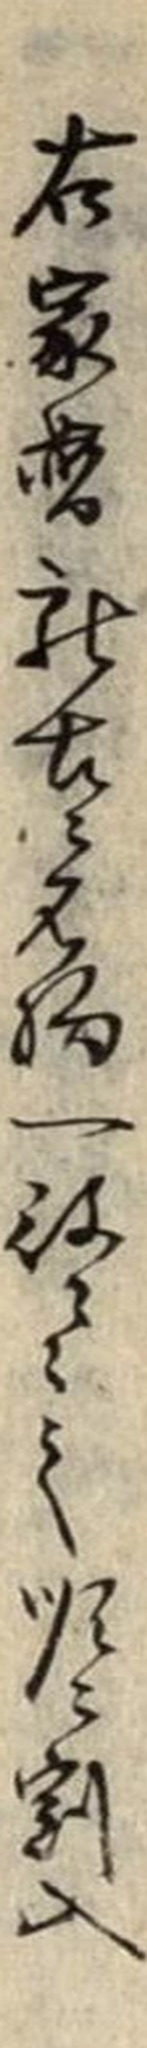右家督新古に不拘一役〳〵之順に割入
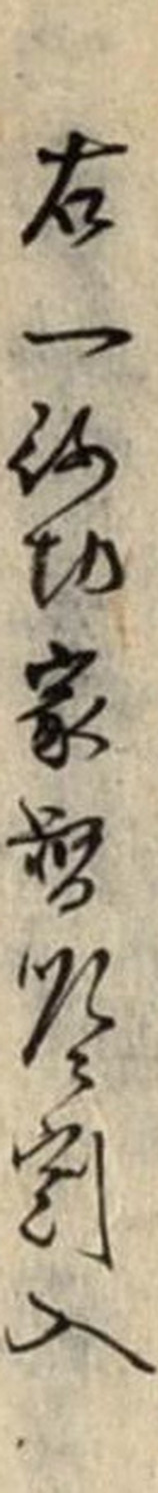右一役切家督順に割入
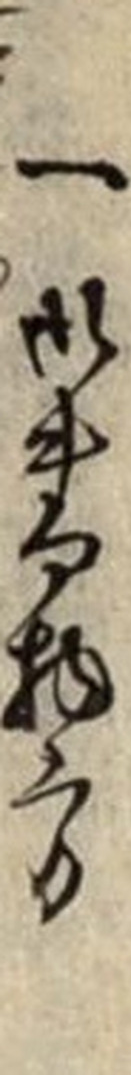一御書物方
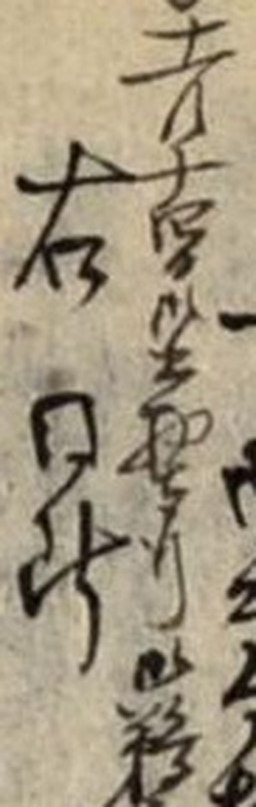右同断
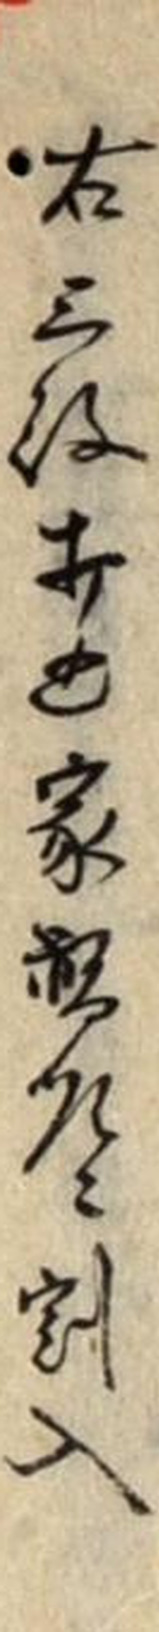右三役打込家督順に割入

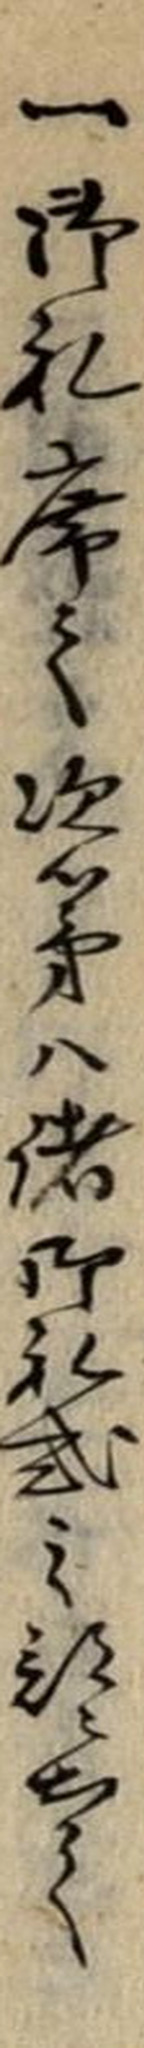一御礼席之次第は諸御礼式之部に出之
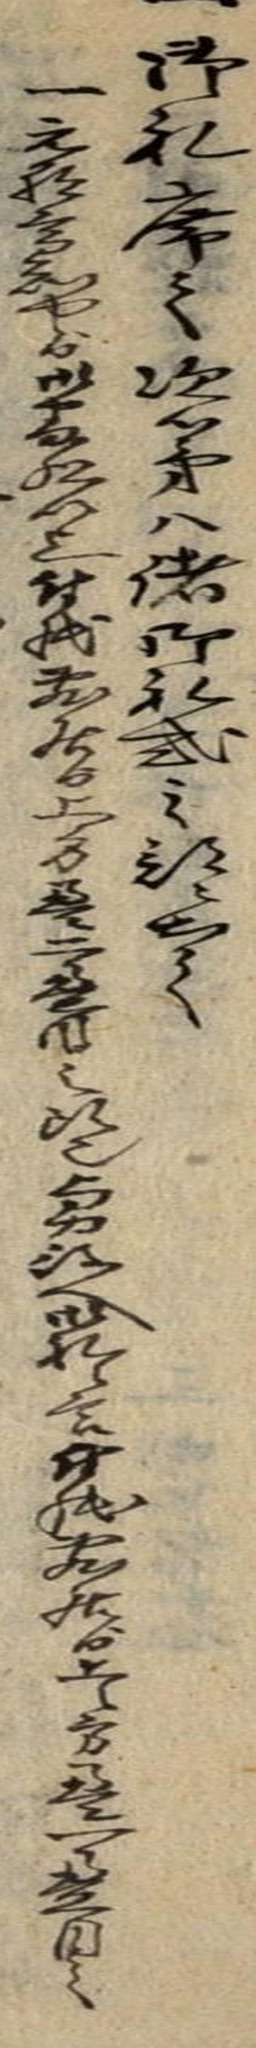一元祖高知中ゟ御番組以上付紙敷居ゟ上方畳二畳目之頭也与力役人御礼之節付紙敷居ゟ上之方畳一畳目之
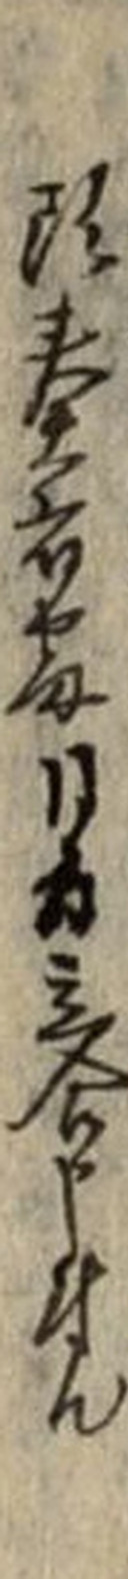頭奏者番目付立合申付ル
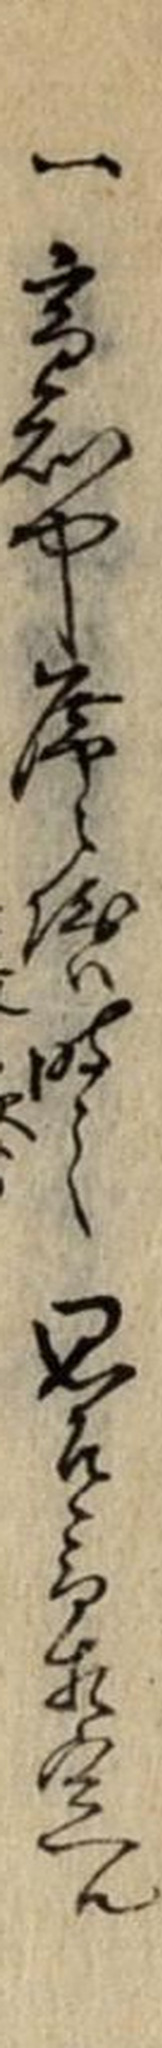一高知中席之儀は時之思召に而相定ル
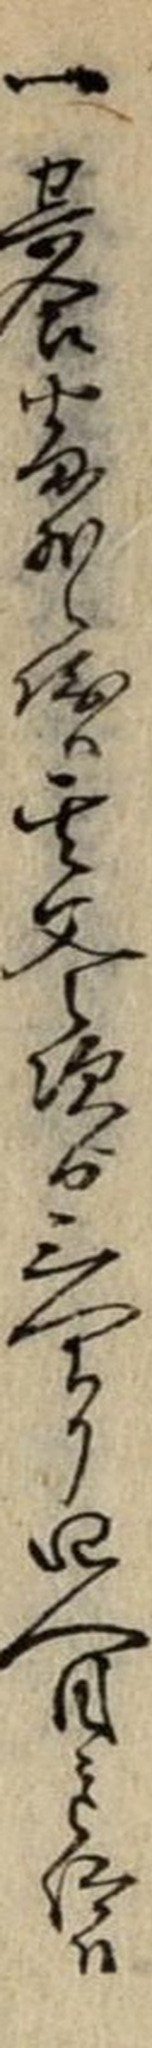一寄合番外之儀は其父之次ゟ三人下り四人目に被仰付
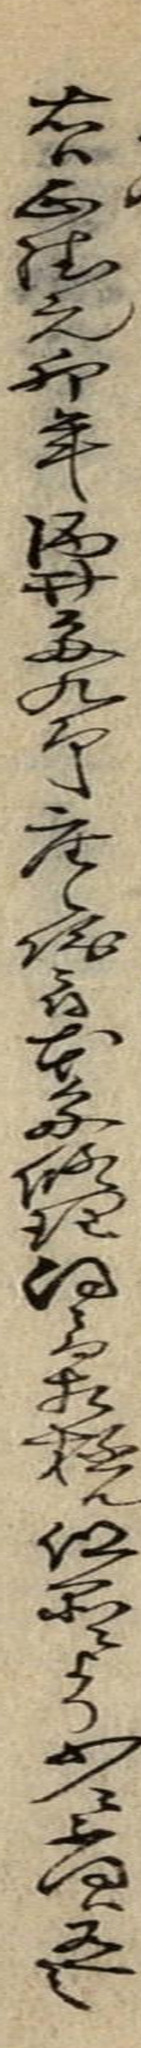右は正徳元卯年酒井多九郎座之儀に付本多修理伺に而相極ル但品により少々不同は有之
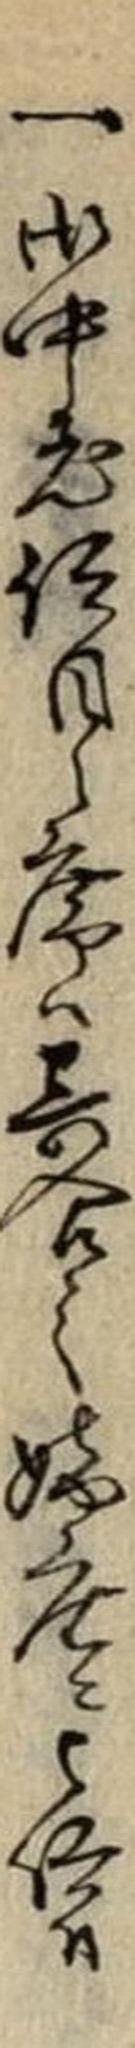一御中老跡目之席は寄合之嫡座に被仰付
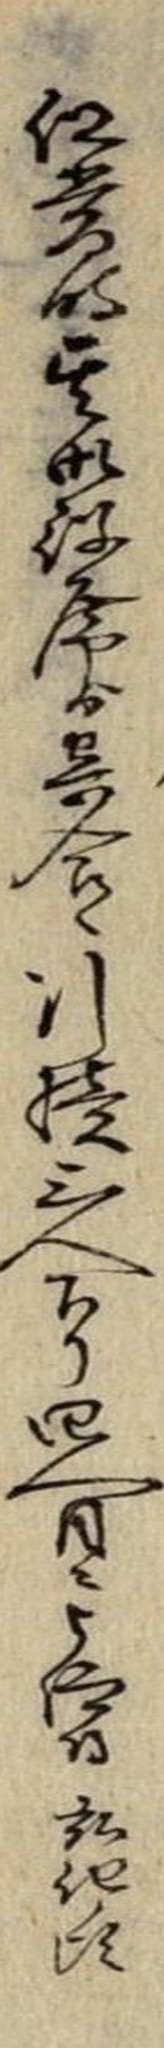但当時其御役席ゟ寄合へ引続三人下り四人目に被仰付弘化ノ頃
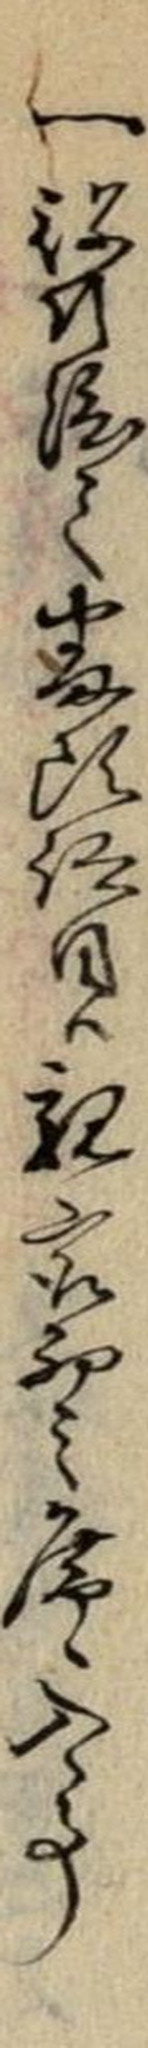一役引渡之番頭跡目は親最初之席へ入候事
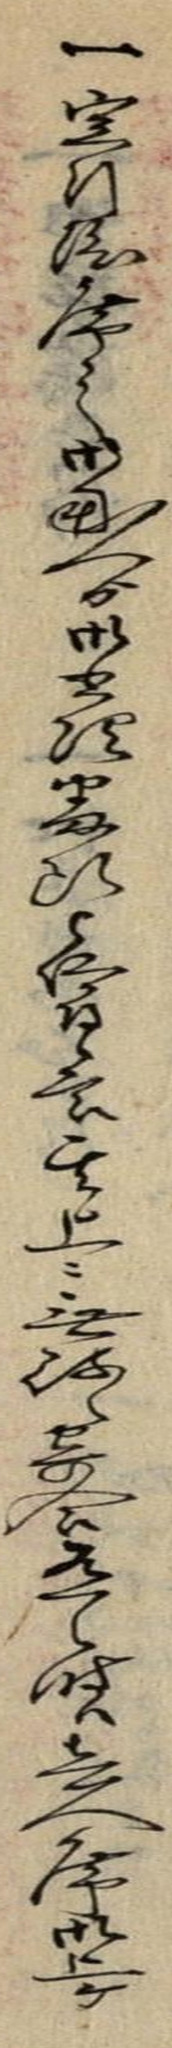一定引渡席之御用人ゟ御書院番頭被仰付候節其上に無役之寄合有之時は壱人席御上ヶ
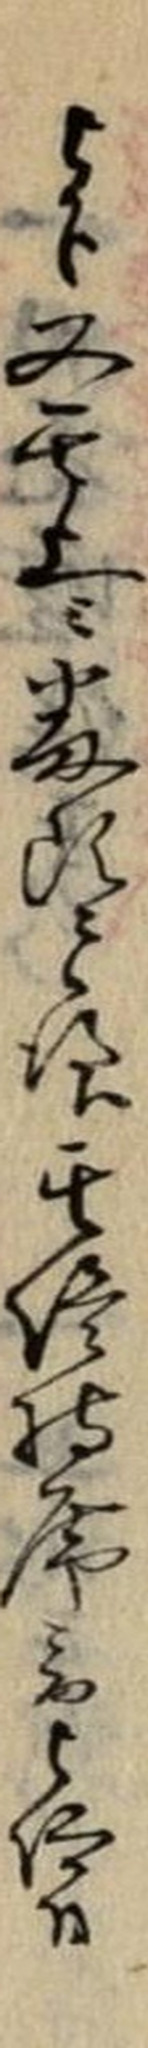被下又其上ミ番頭に候得は其侭持席に而被仰付
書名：御用并被仰出之部
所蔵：福井県文書館 Fukui Prefectural Archives
